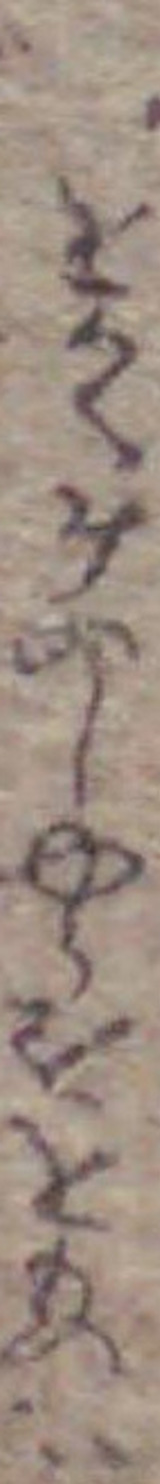をかくまいしやうすをもの
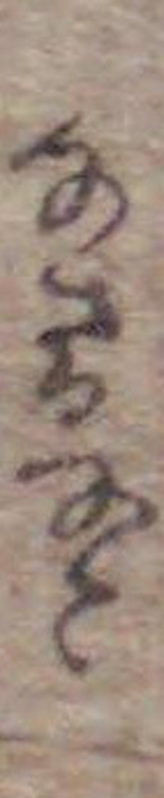なさるなと
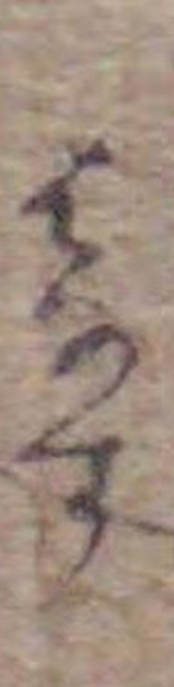はなす

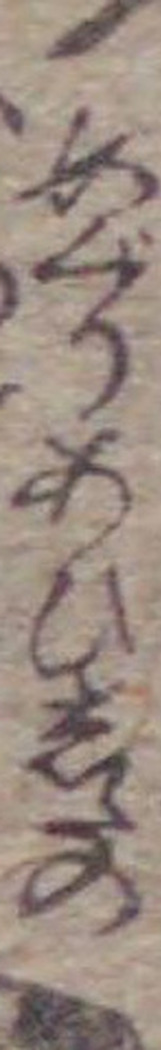めぐりあひしたの
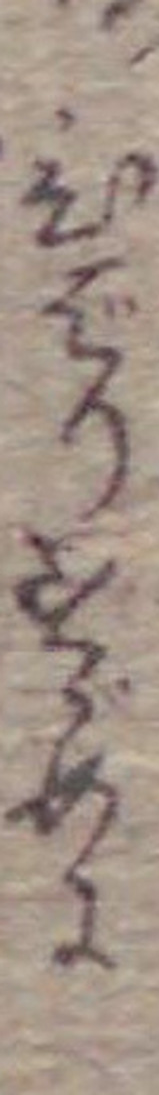ひばりすゞめに
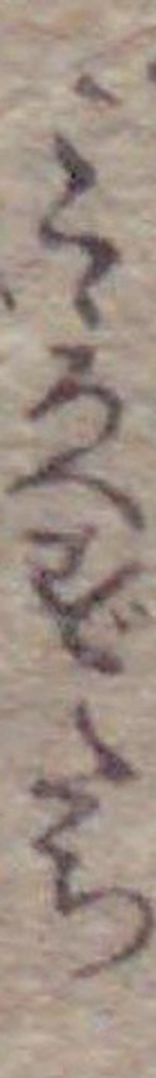こゝろへずたち
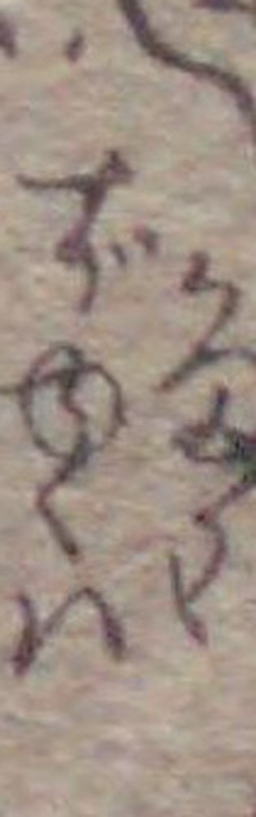ずゆくは
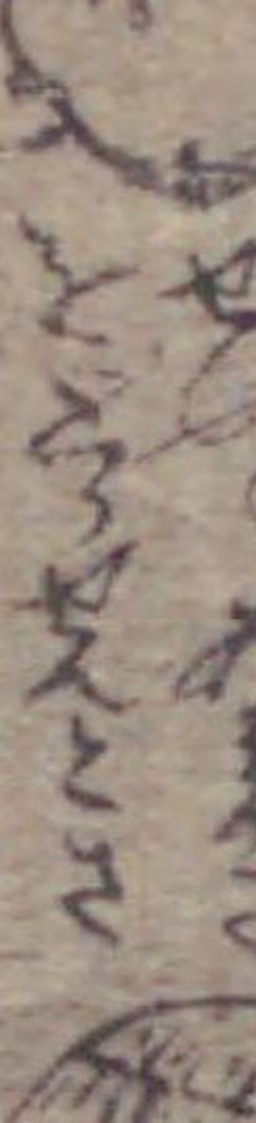をとらせんとさ
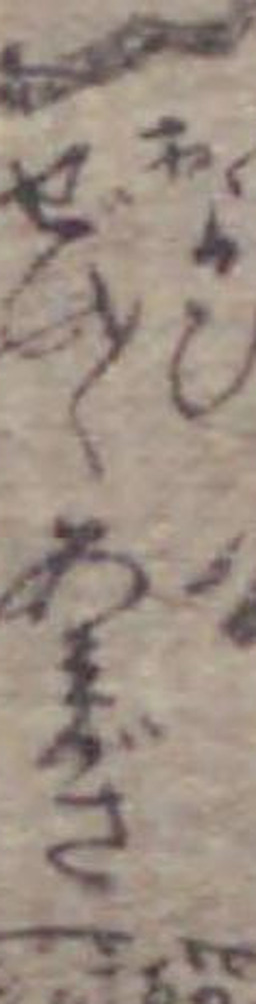ぜひ〳〵あみがさ
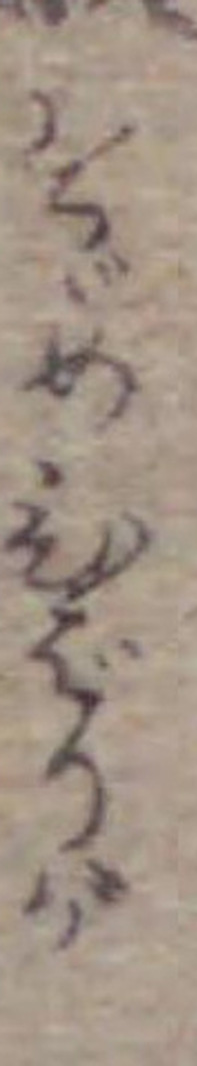すゞめひばりが
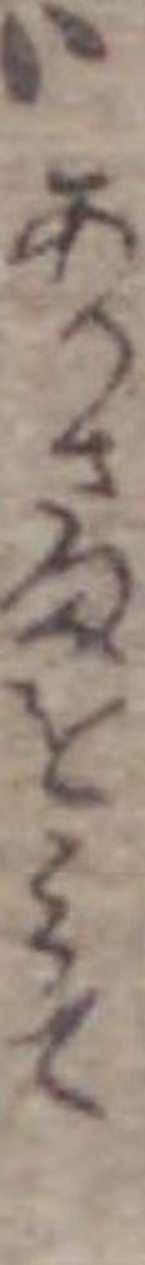ありさまをみて
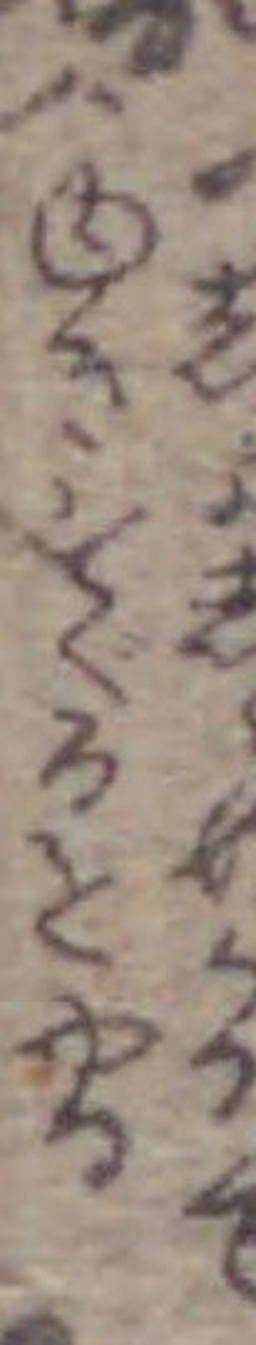ゆきすぐるをやる
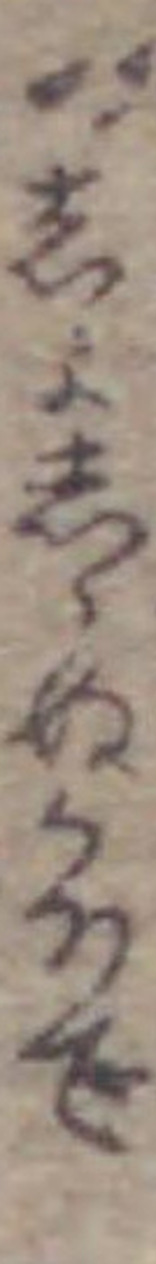しよしらぬかほで

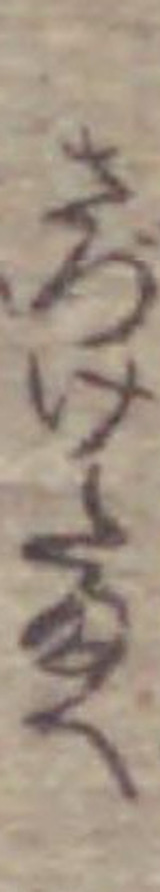さづけたまへ
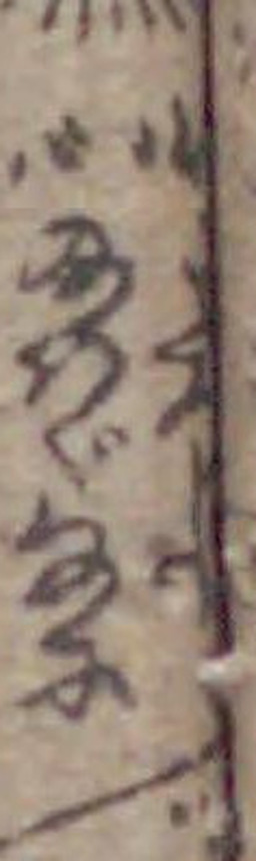給はゞなに
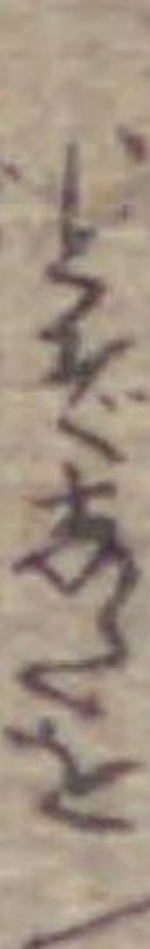とぞしたを
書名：嘘八百温故新知 : 2巻
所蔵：国立国会図書館 National Diet Library, JAPAN
